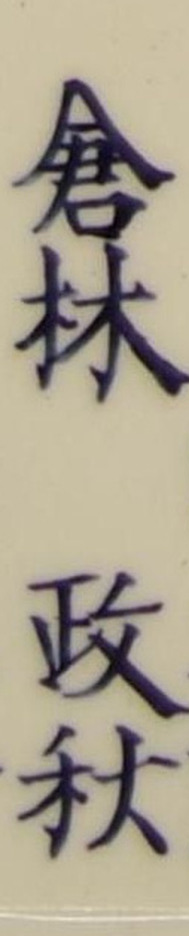倉林政秋
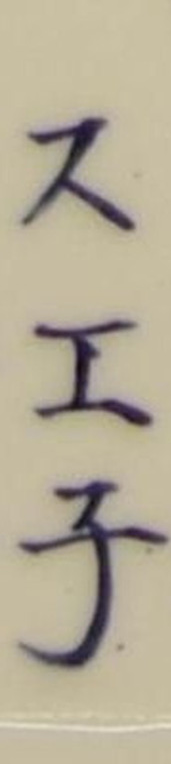スエ子
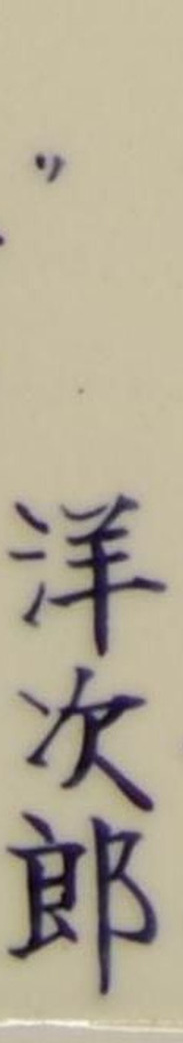洋次郎
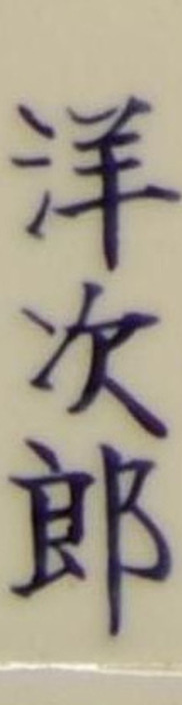洋次郎

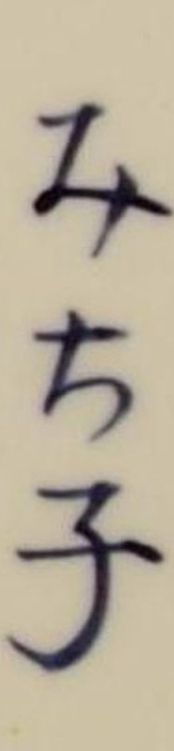みち子
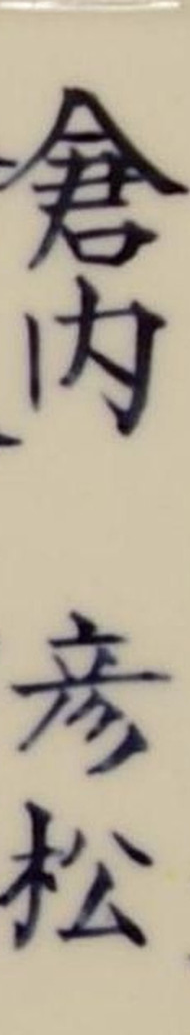倉内彦松
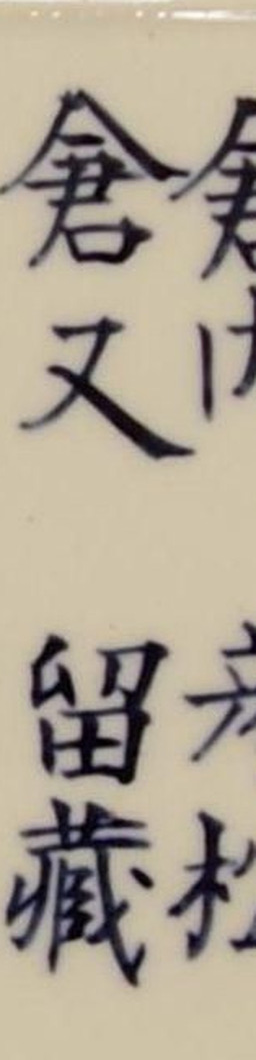倉又留蔵
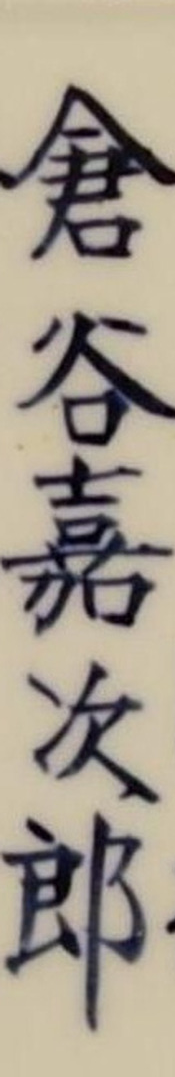倉谷嘉次郎
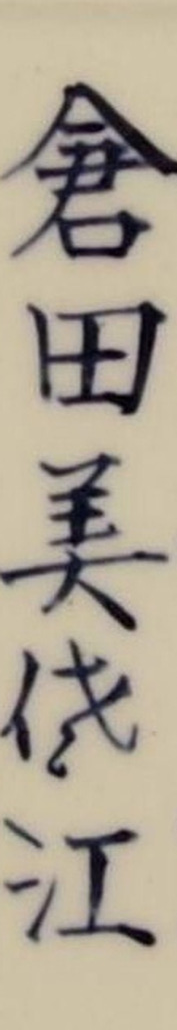倉田美佐江
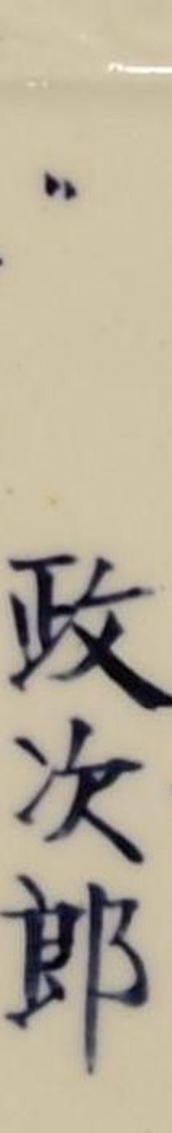政次郎
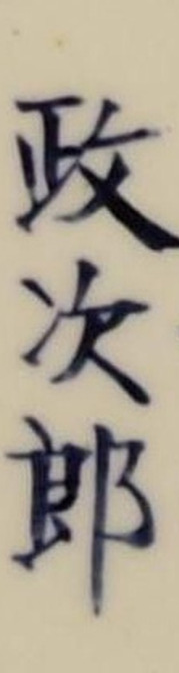政次郎
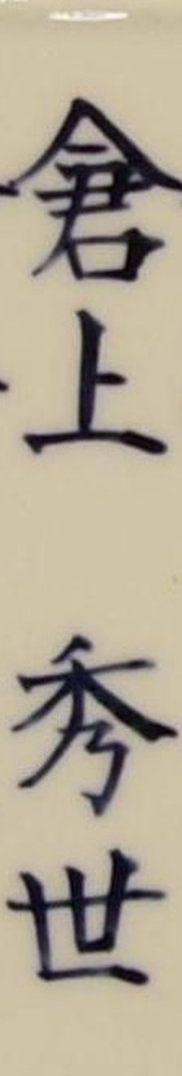倉上秀世
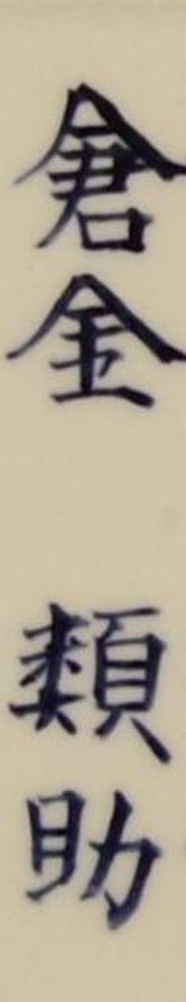倉金類助
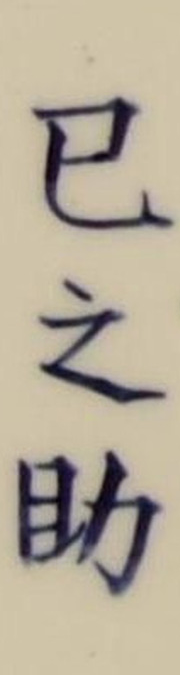巳之助
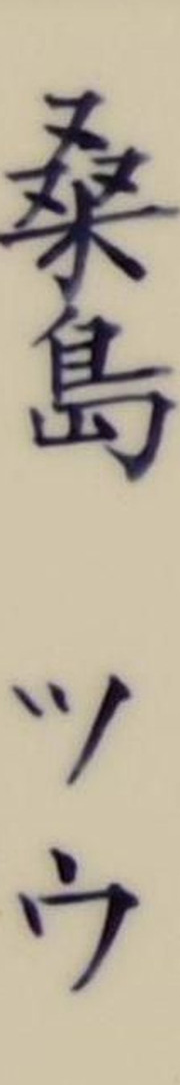桑島ツウ
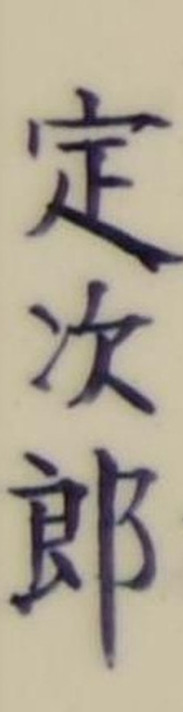定次郎
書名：A~D
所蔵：koyasan kongobuji
